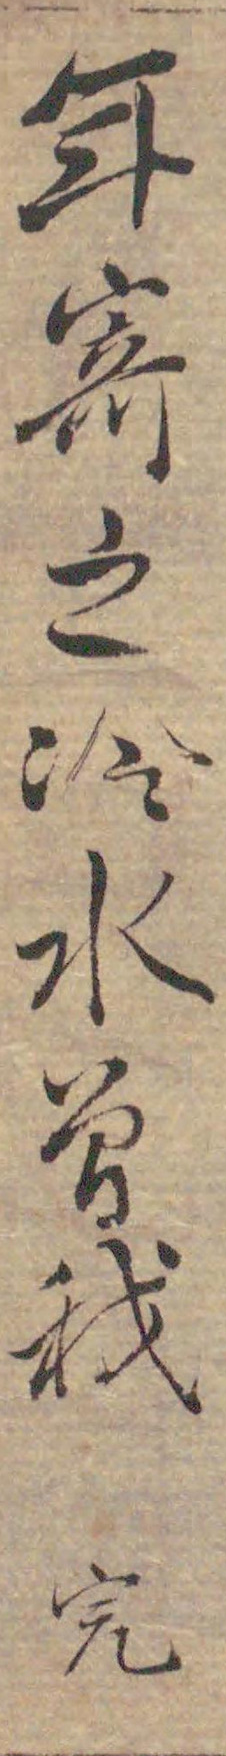年寄之冷水曽我完

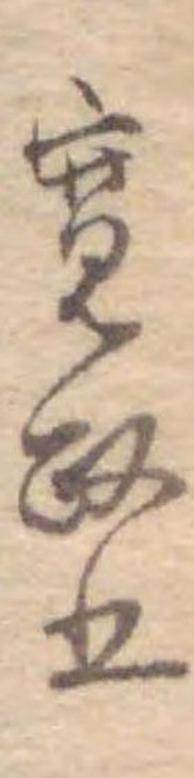寛政五
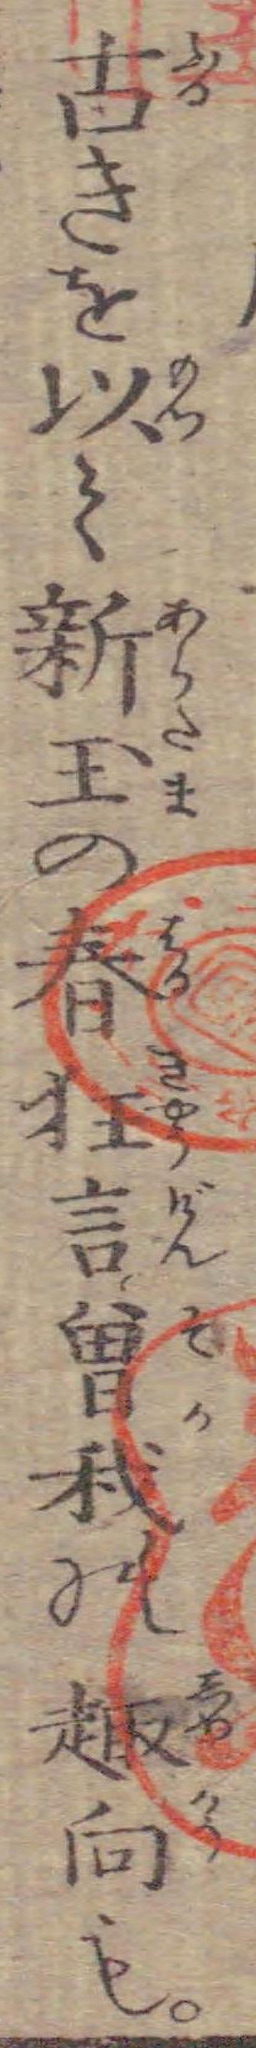古きを以て新玉の春狂言曽我の趣向も。
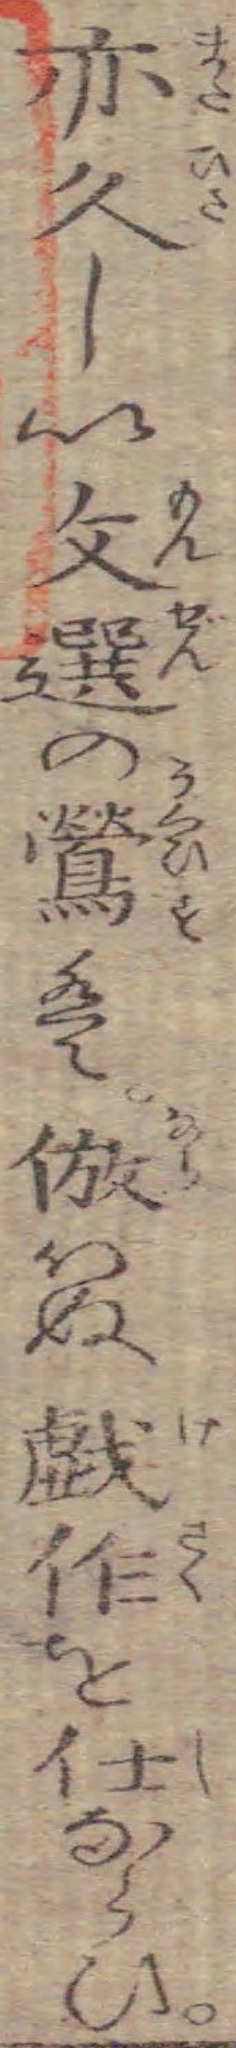亦久しい文選の鴬は。做はぬ戯作を仕ならひ。
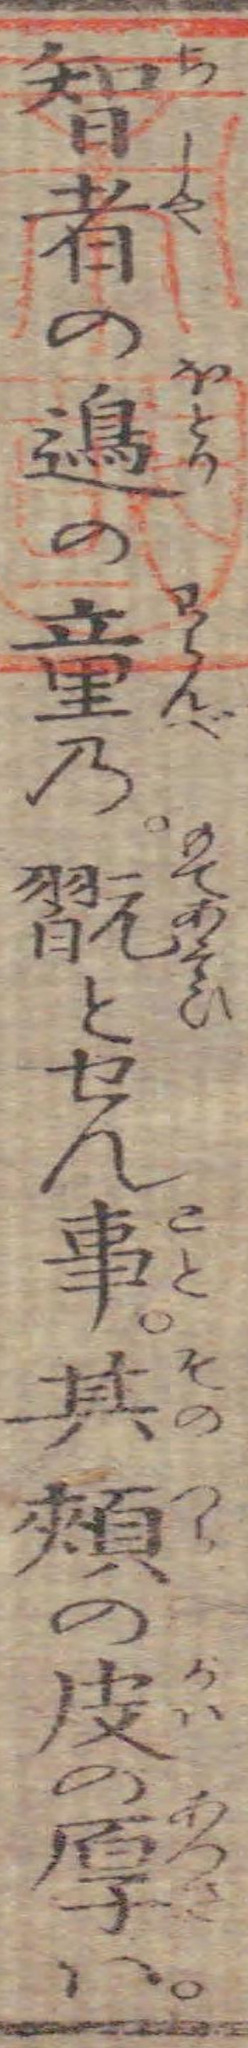智者の辺の童の。翫とせん事。其頬の皮の厚は。
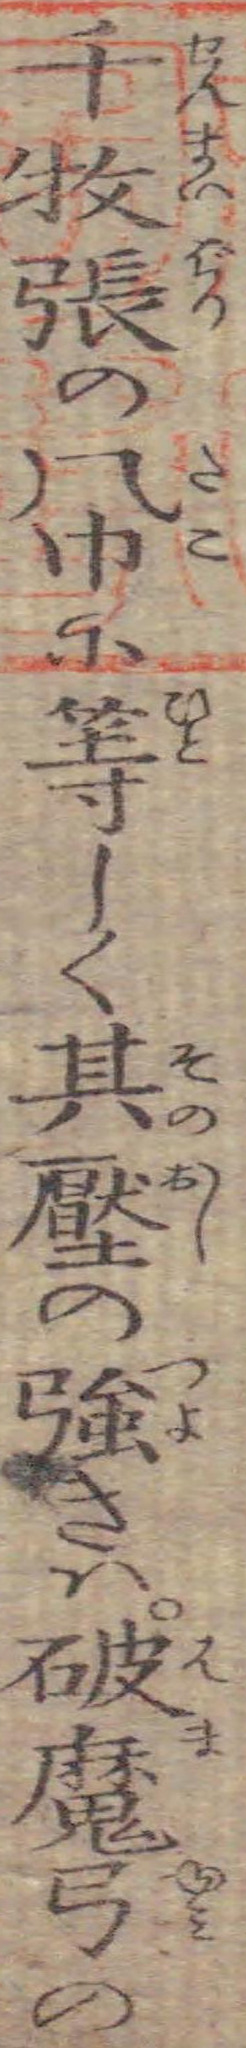千牧張の凧に等しく其圧の強きは。破魔弓の
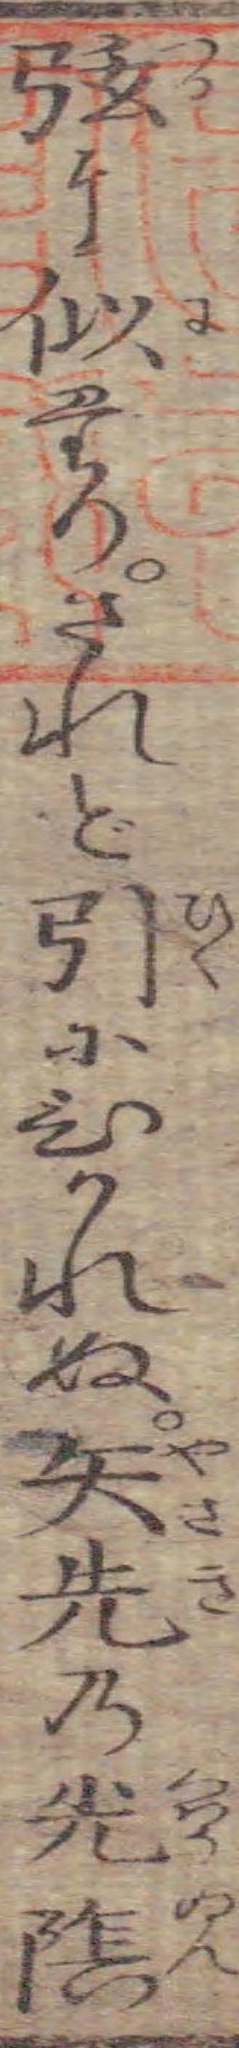弦に似たり。されど引にひかれぬ。矢先の光陰
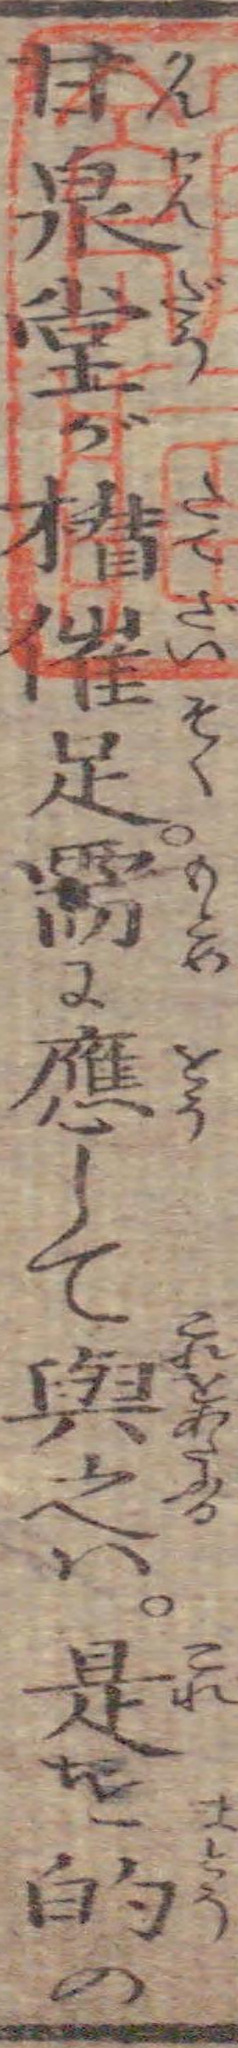甘泉堂が楯催足。需に応して与之は。是を的の
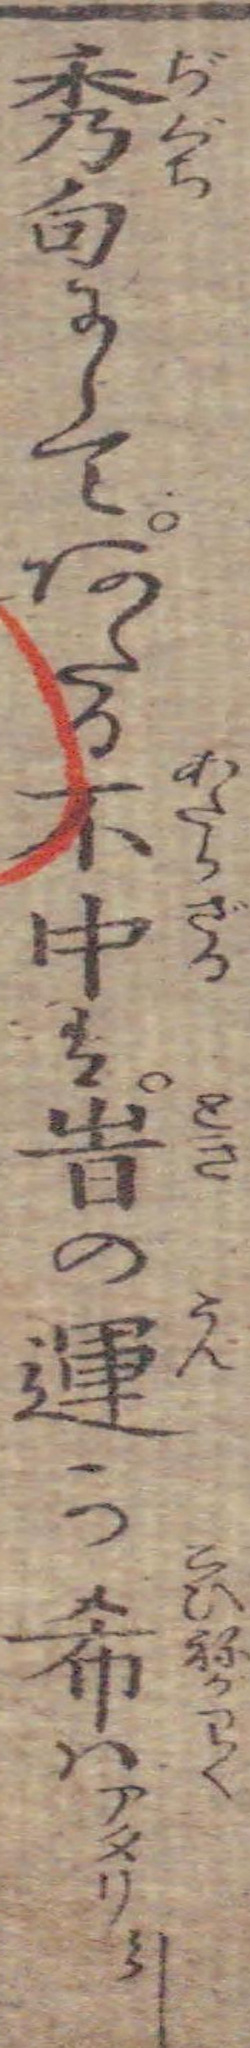秀句にして。あたる不中は。旹の運か希はアタリ引

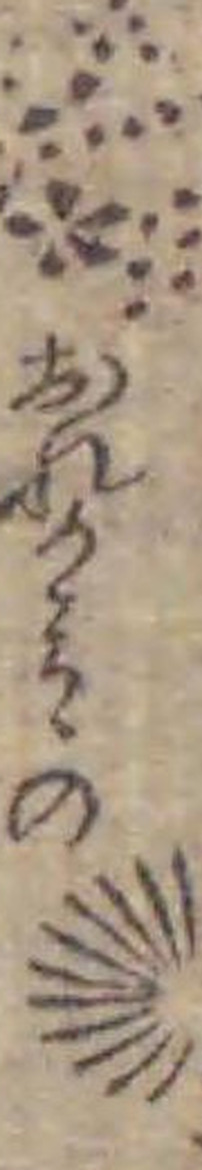おれかみゝの
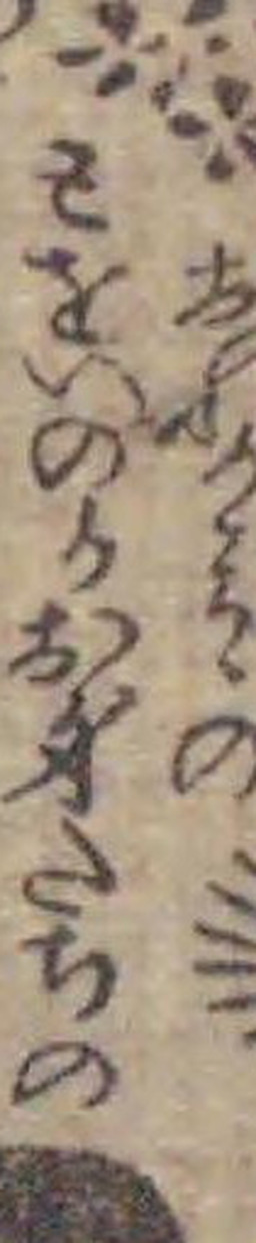ことをいのりお身たちの
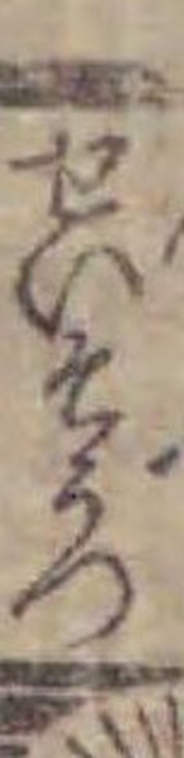せいそうつ
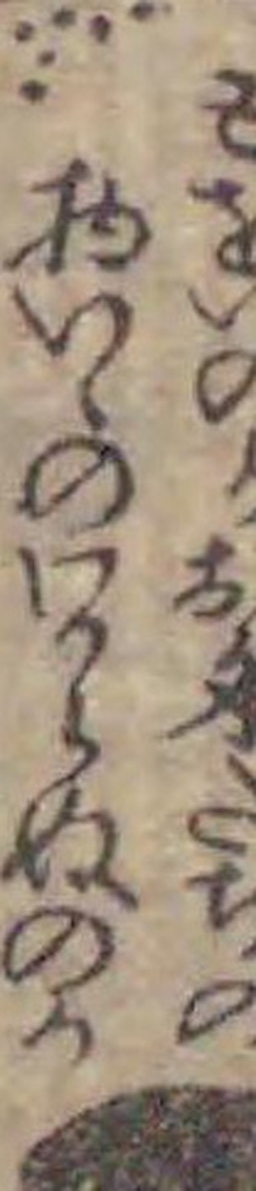物いゝのわからぬのか
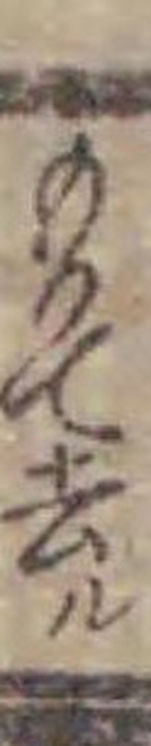もりて去ル
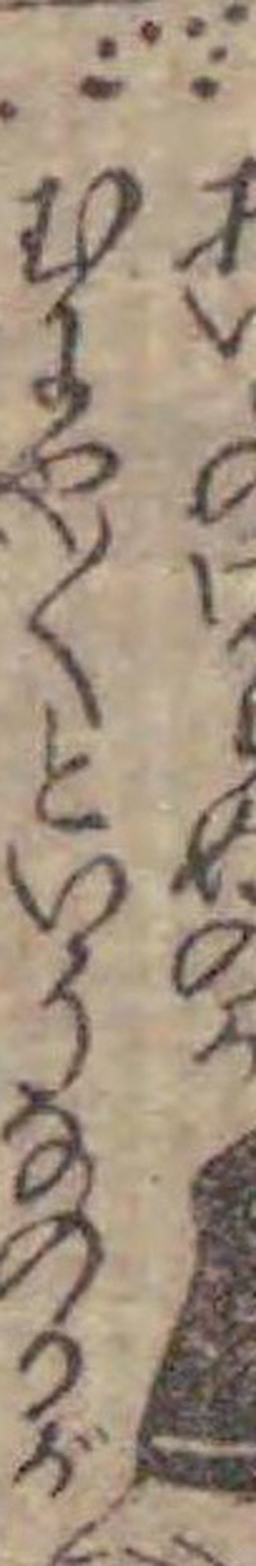むにや〳〵というなのりが
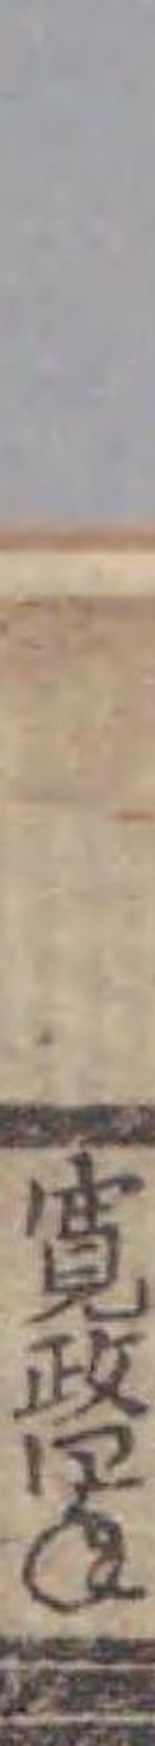寛政四年
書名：年寄之冷水曽我 : 3巻
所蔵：国立国会図書館 National Diet Library, JAPAN
